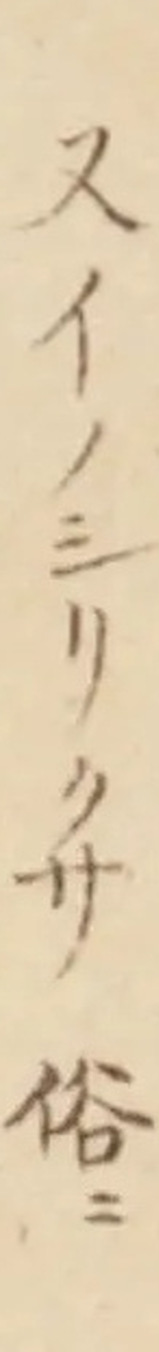又イノシリクサ俗
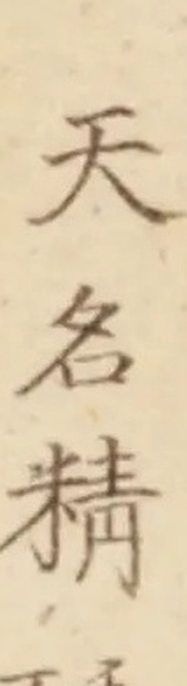天名精
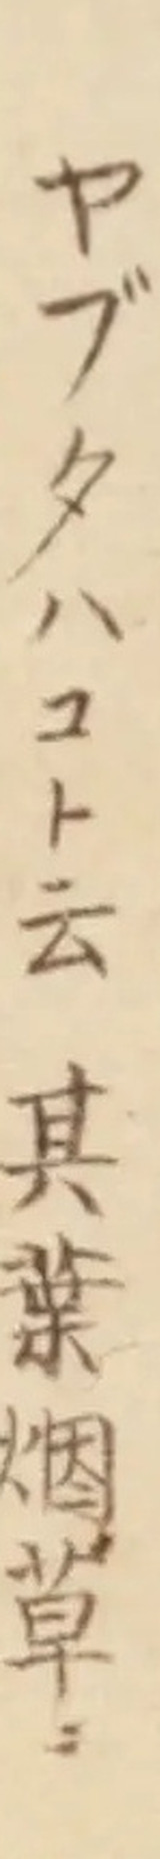ヤブタハコト云其葉煙草
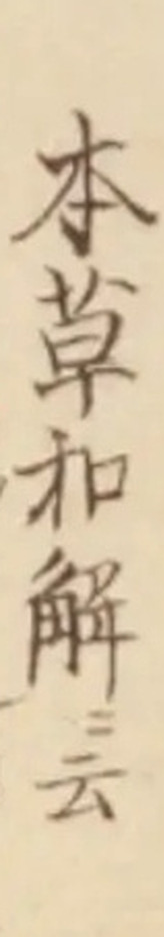本草和解云
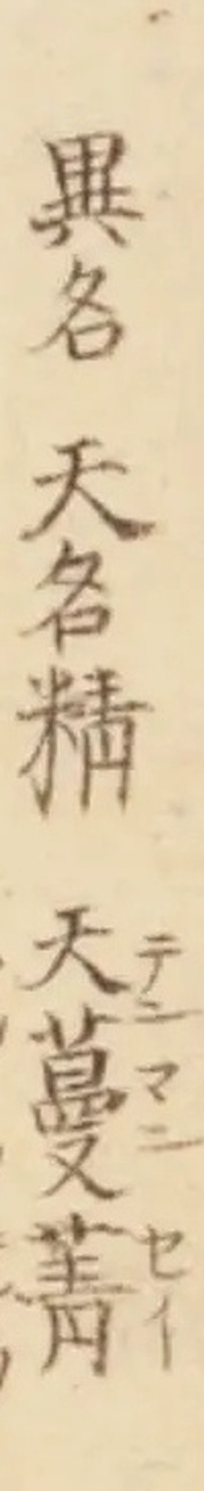異名天名精天蔓菁
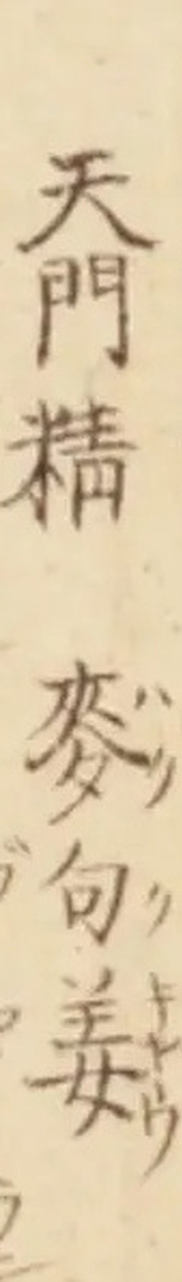天門精麦句姜
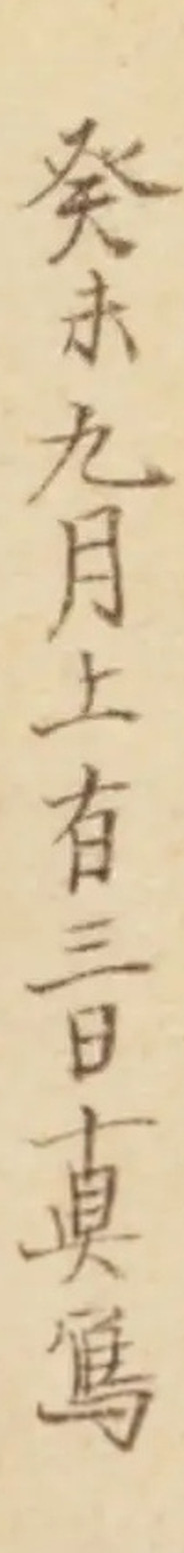癸未九月上有三日真写

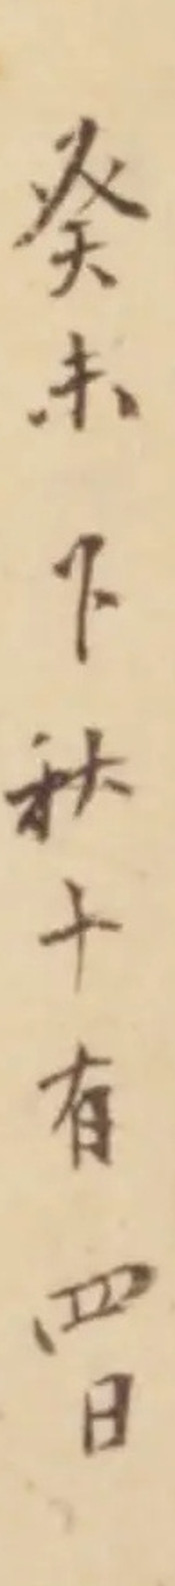癸未下秋十有四日
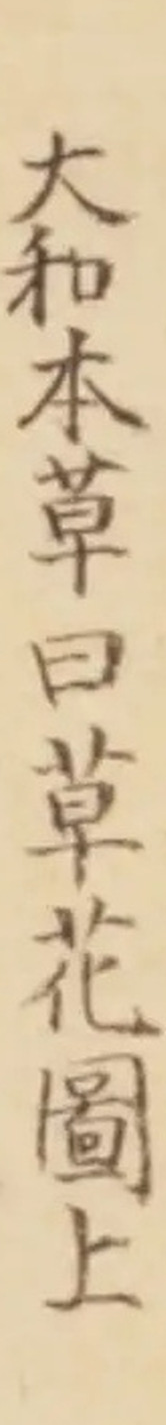大和本草曰草花図上
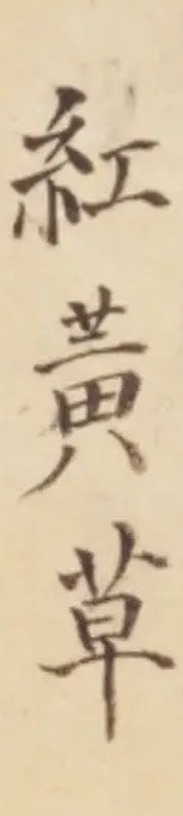紅黄草
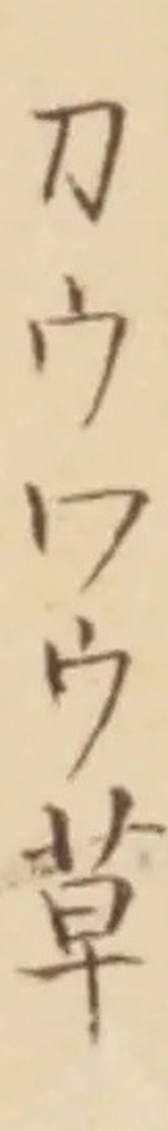カウワウ草
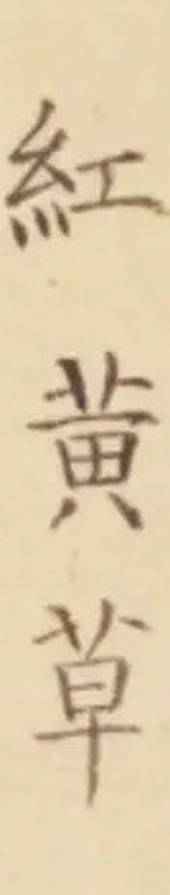紅黄草
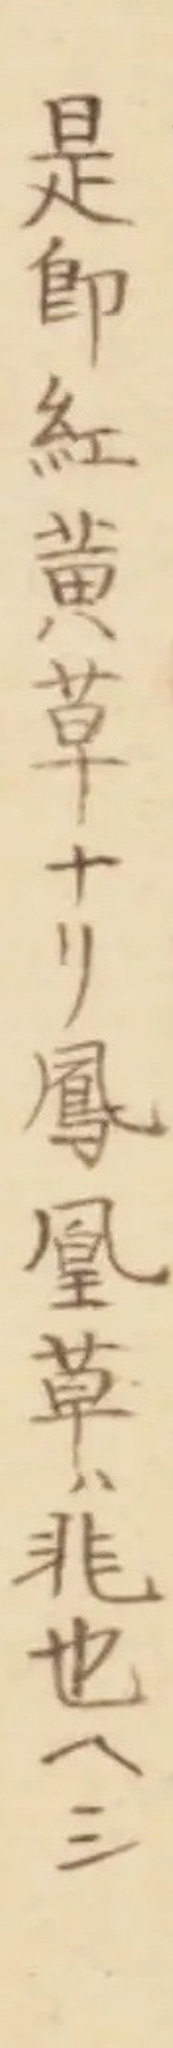是即紅黄草ナリ鳳凰草非也ヘシ

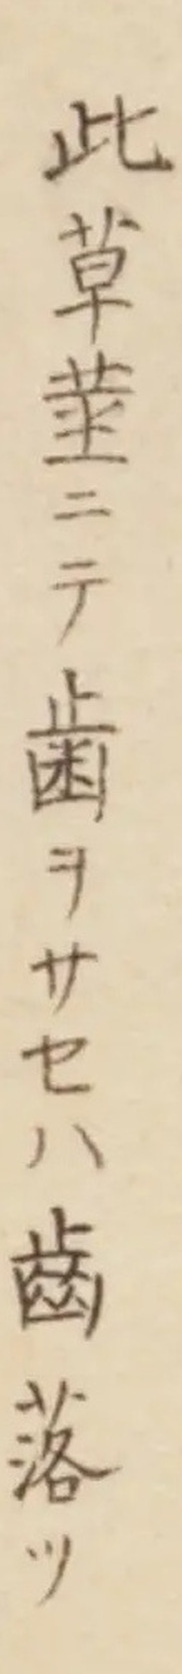此草茎ニテ歯ヲサセハ歯落ツ
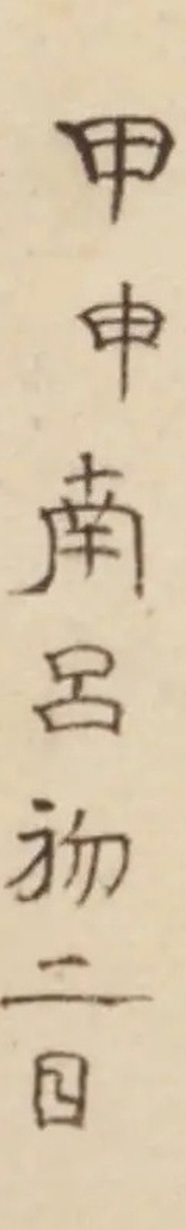甲申南呂二日

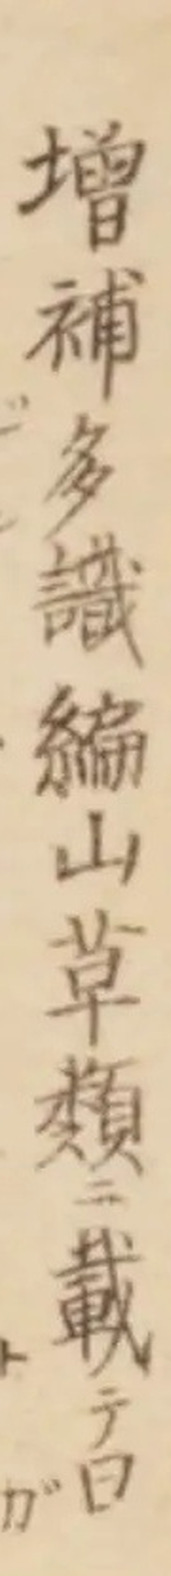増補多識編山草類ニ載テ曰
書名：梅園草木花譜秋之部. 2
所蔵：国立国会図書館 National Diet Library, JAPAN
